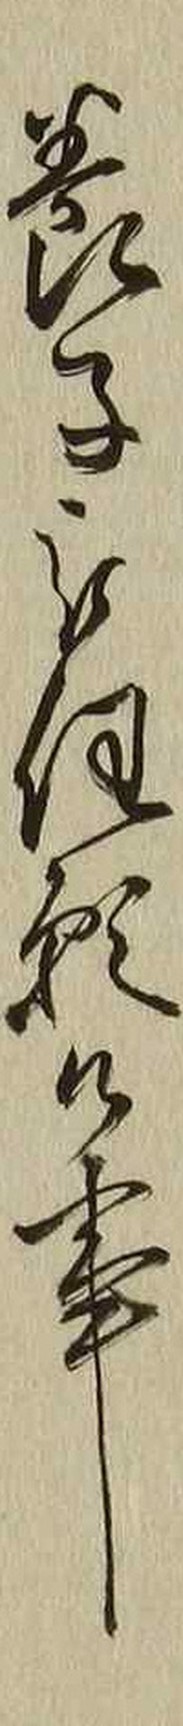養子被任願候事
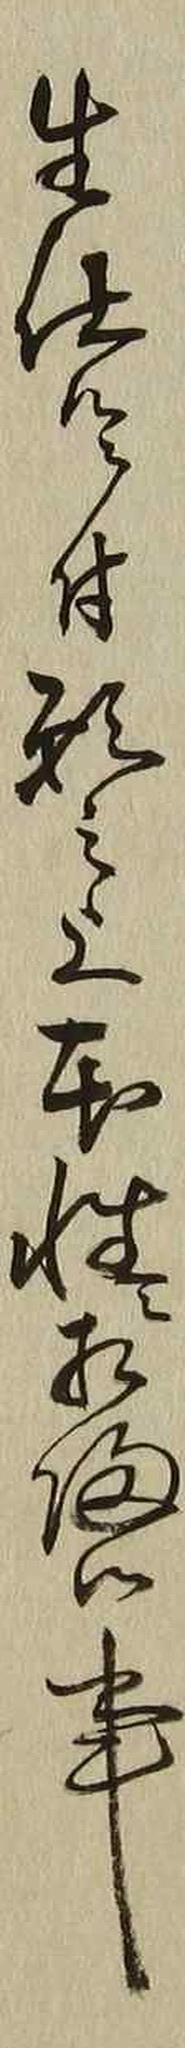生仕候ニ付願之上本性ニ相帰候事
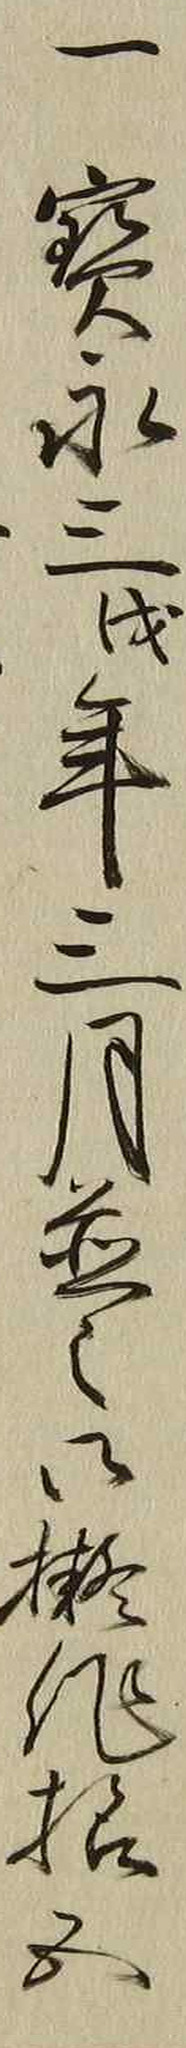一寛永三戌年三月並之御擬作様五
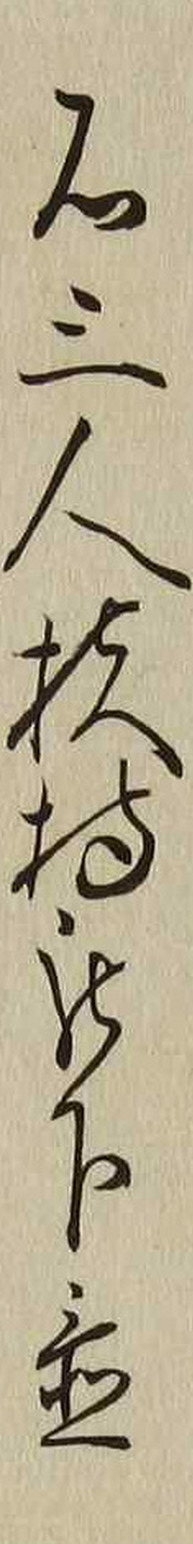石三人扶持被下置
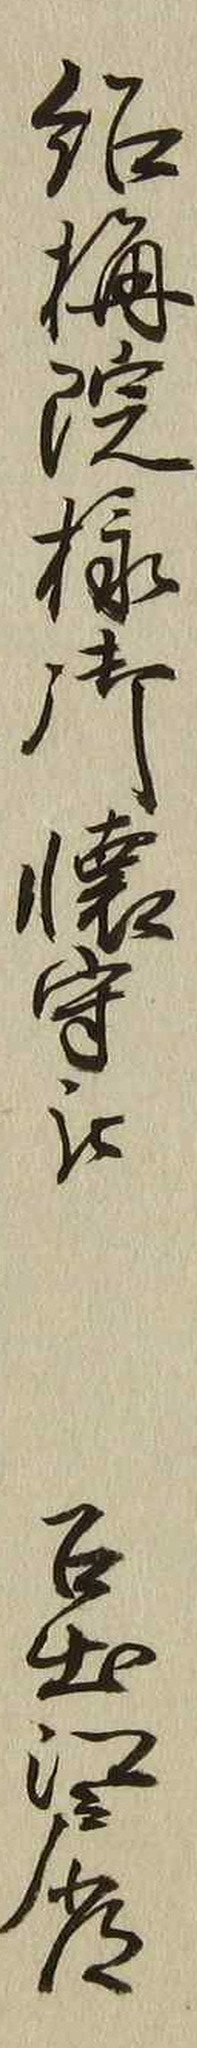紹栴院様御懐守被召出江戸常
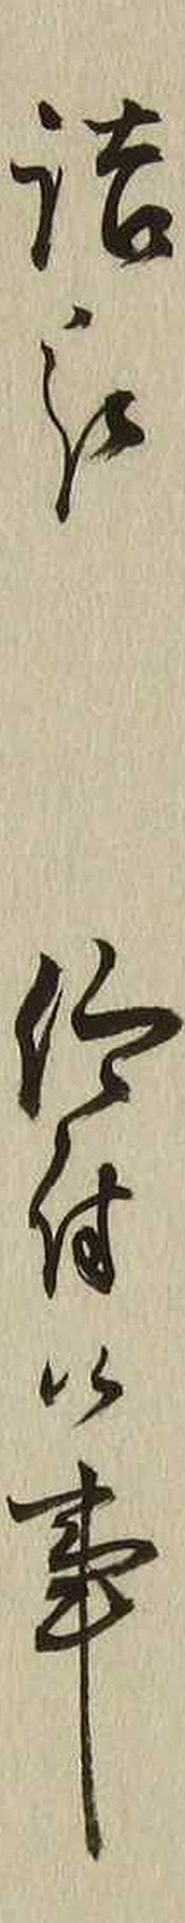詰被仰付候事
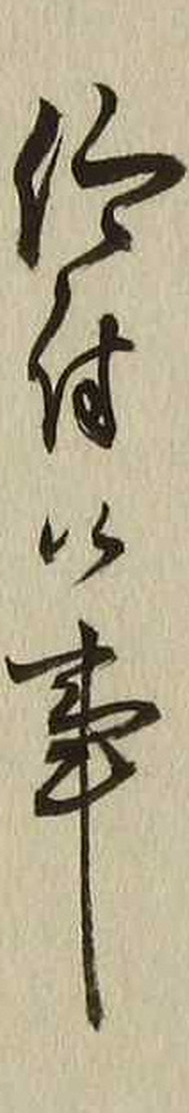仰付候事
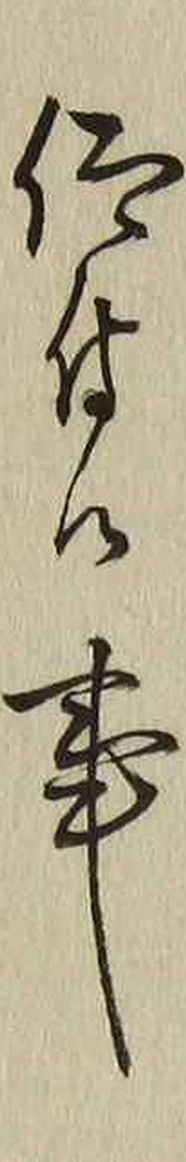仰付候事
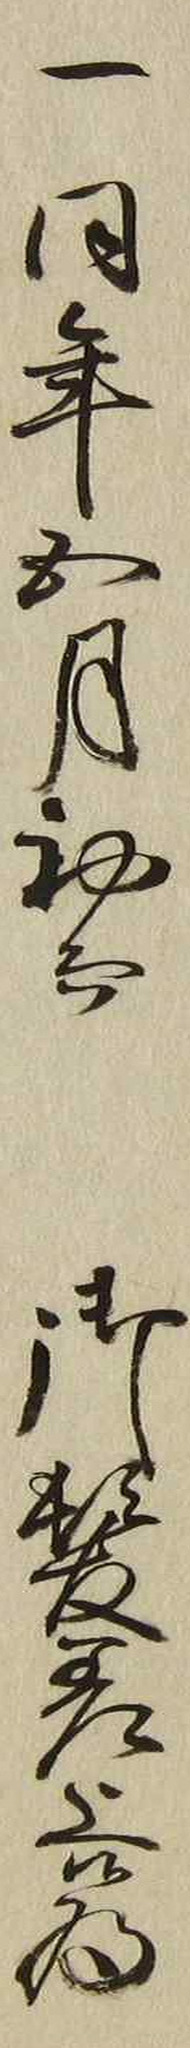一同年五月初而御髪差上候為
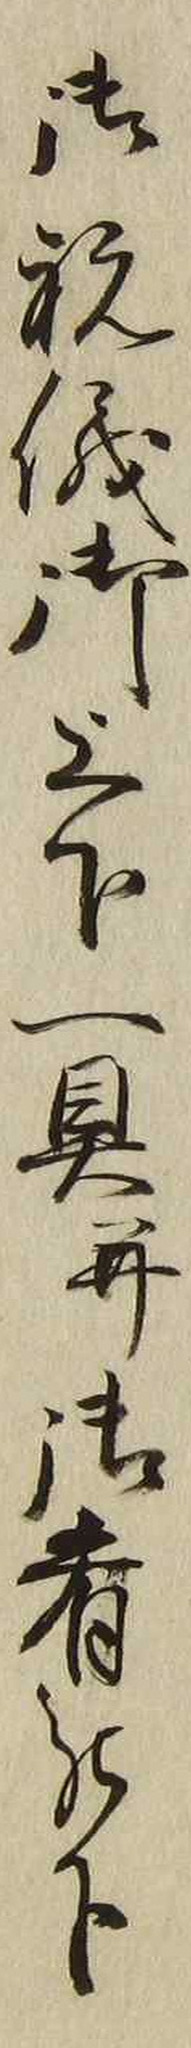御祝儀御上下一具幷御肴被下
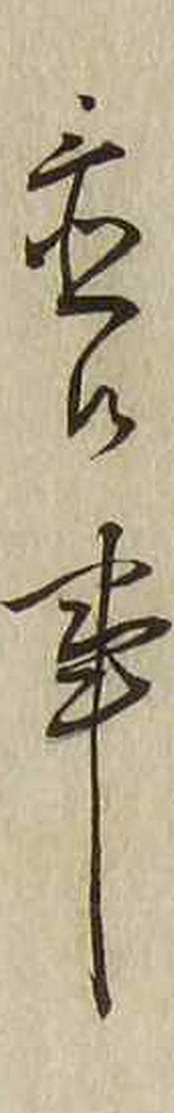置候事

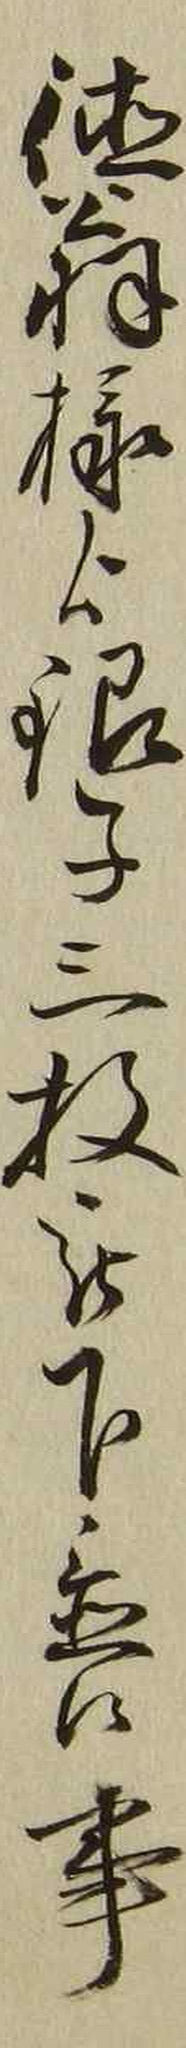徳翁様ゟ銀子三枚被下置候事
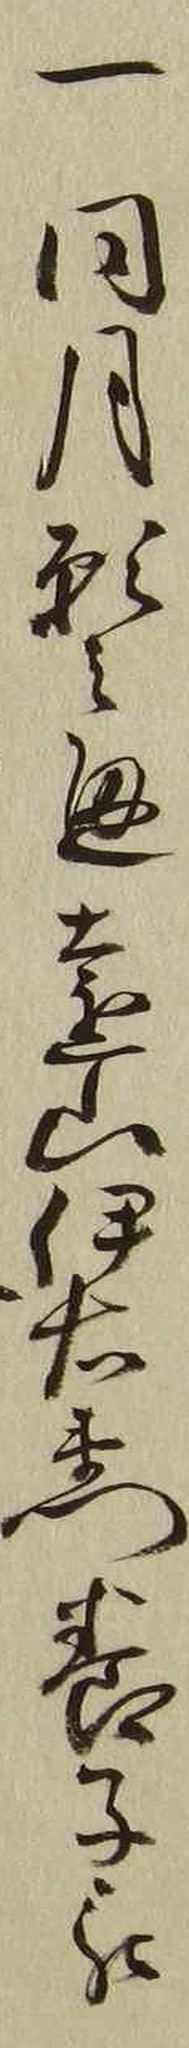一同月願之通遠山伊右衛門養子被
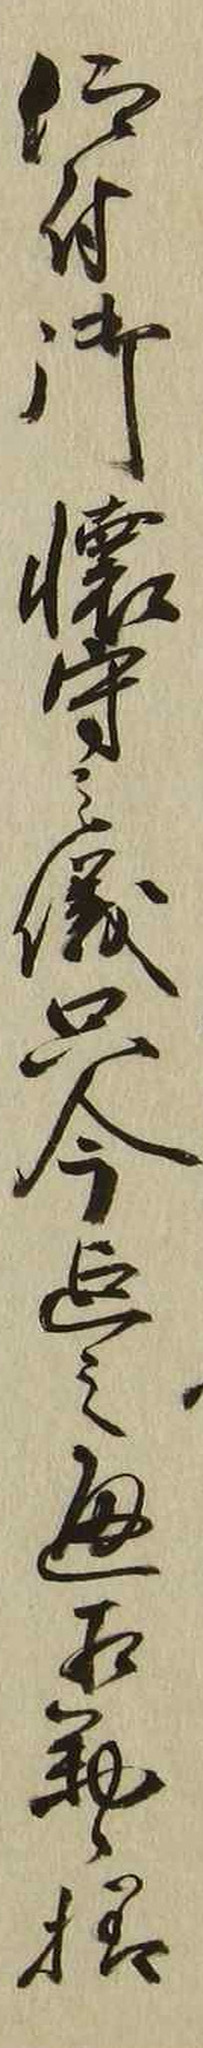仰付御懐守之儀只今迄之通相勤候様
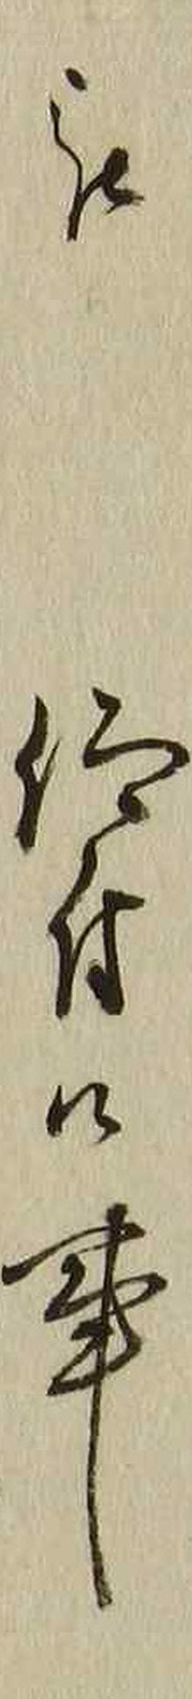被仰付候事
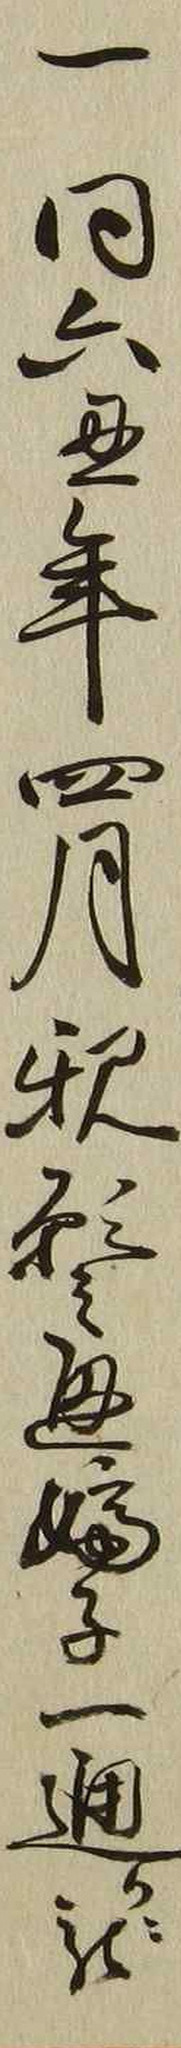一同六丑年四月親願之通嫡子一通りニ被
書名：諸士系譜　巻之60　と之部3
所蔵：会津若松市立会津図書館
